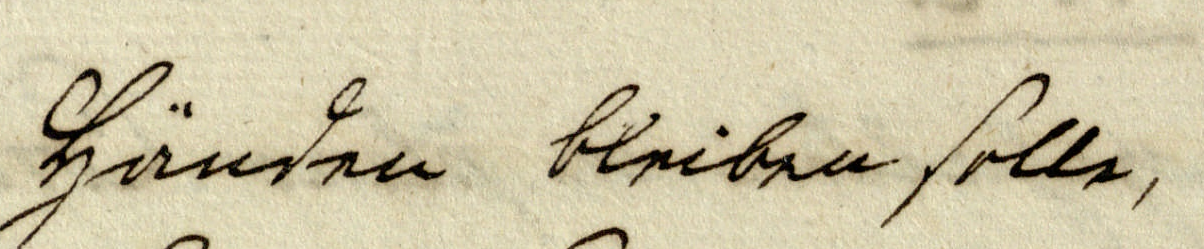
Händen bleiben solle,
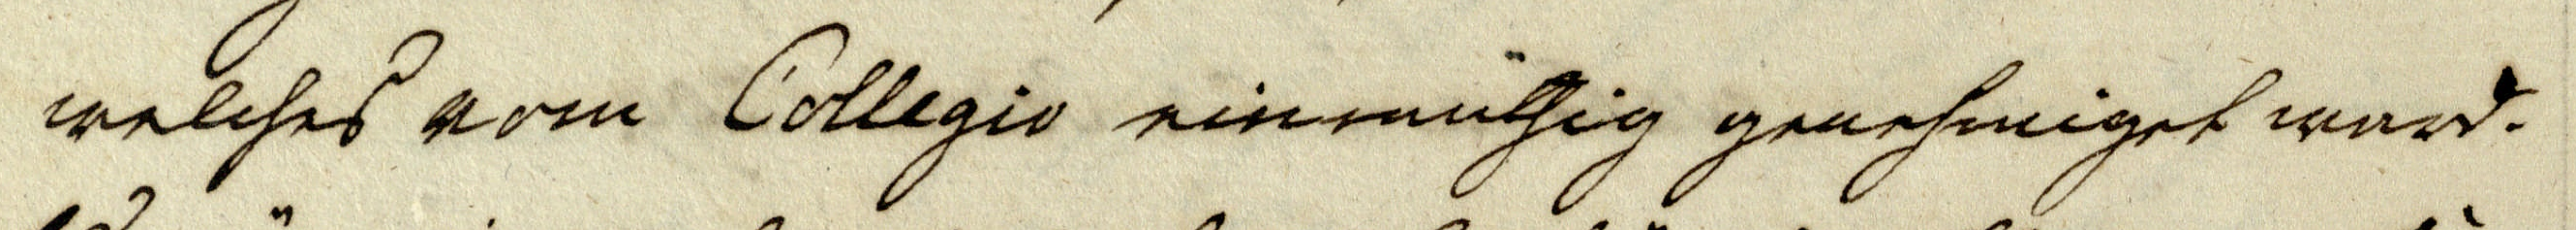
welches vom Collegio einmüthig genehmiget ward.
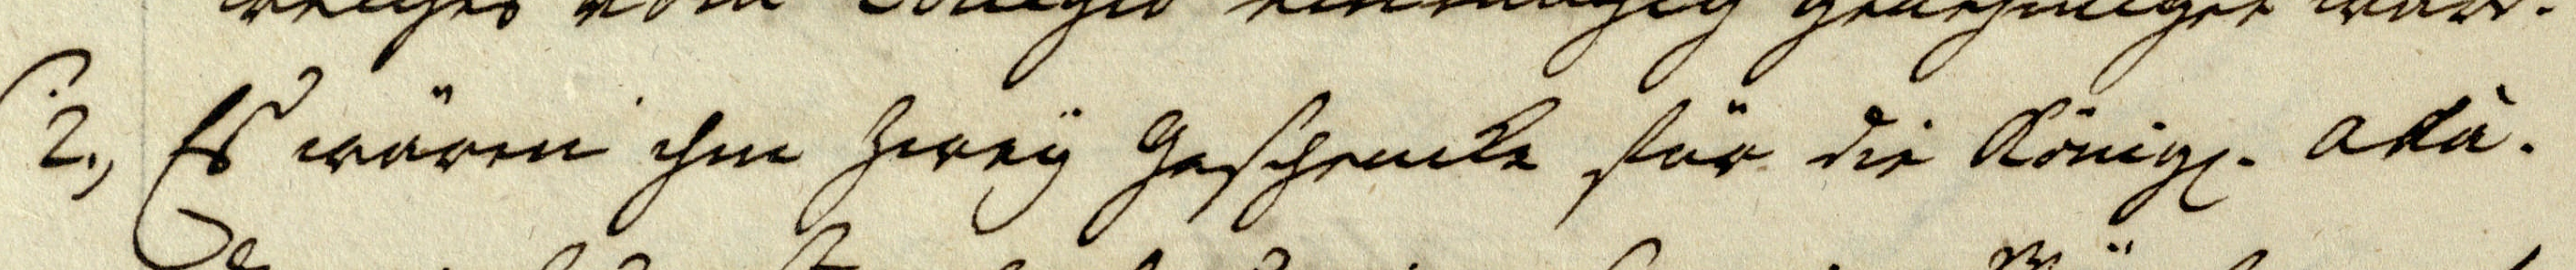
2, Es wären ihm zweÿ Geschencke für die Königl. Aka¬
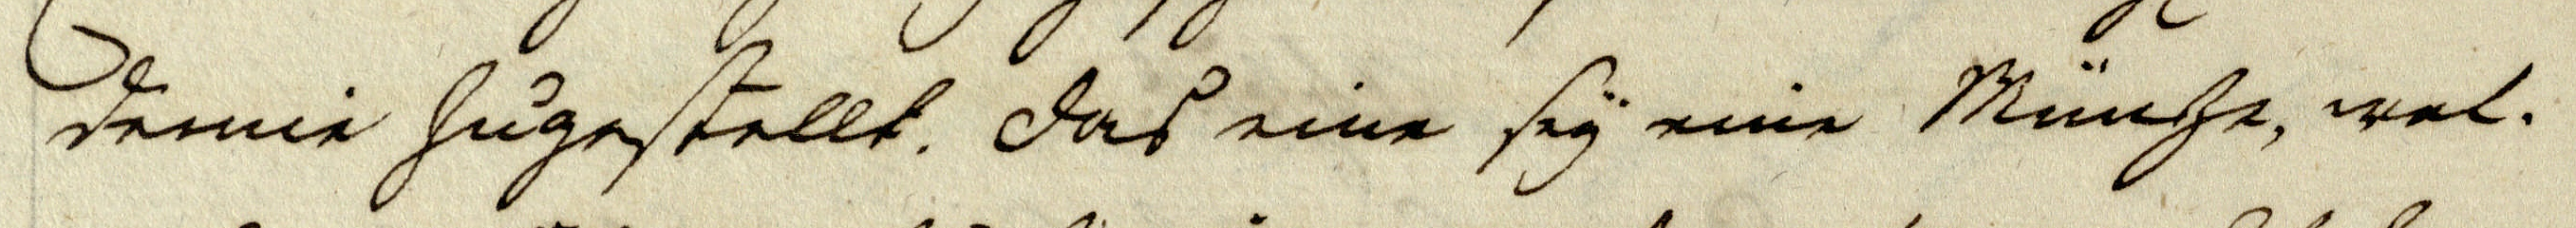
demie zugestellet. Das eine seÿ eine Münze, wel¬
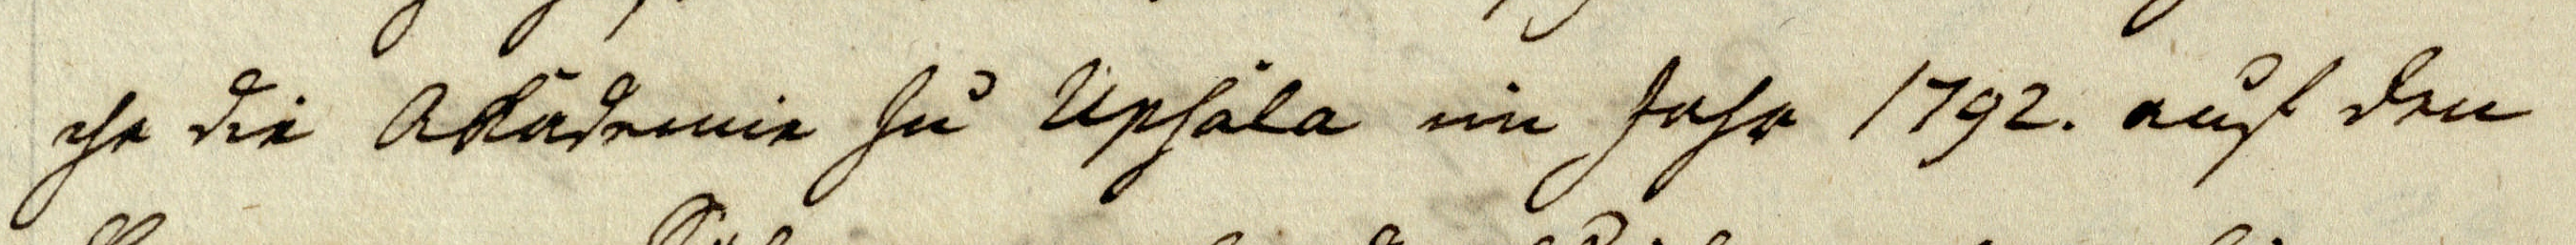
che die Akademie zu Upsala in Jahr 1792. auf den
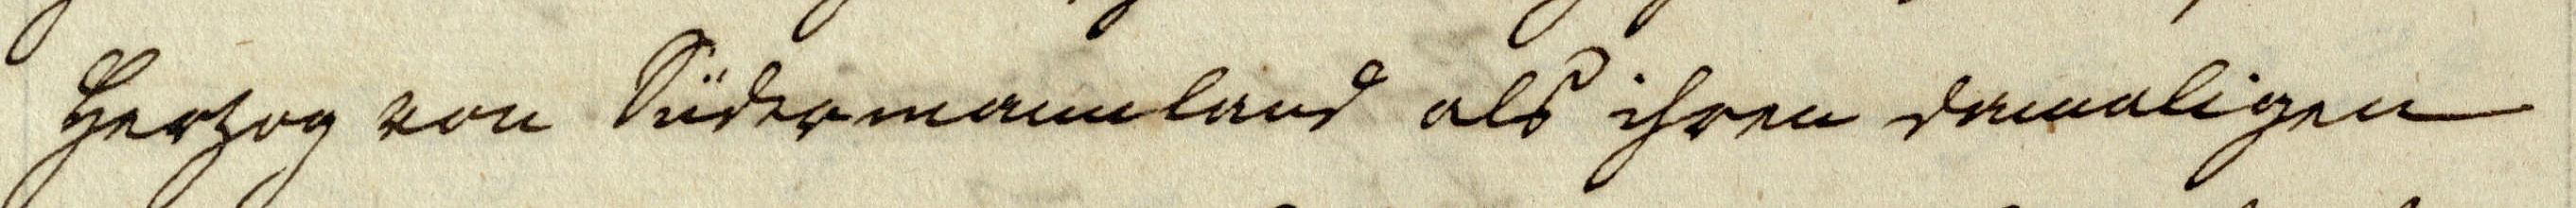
Herzog von Südermannland als ihren damaligen
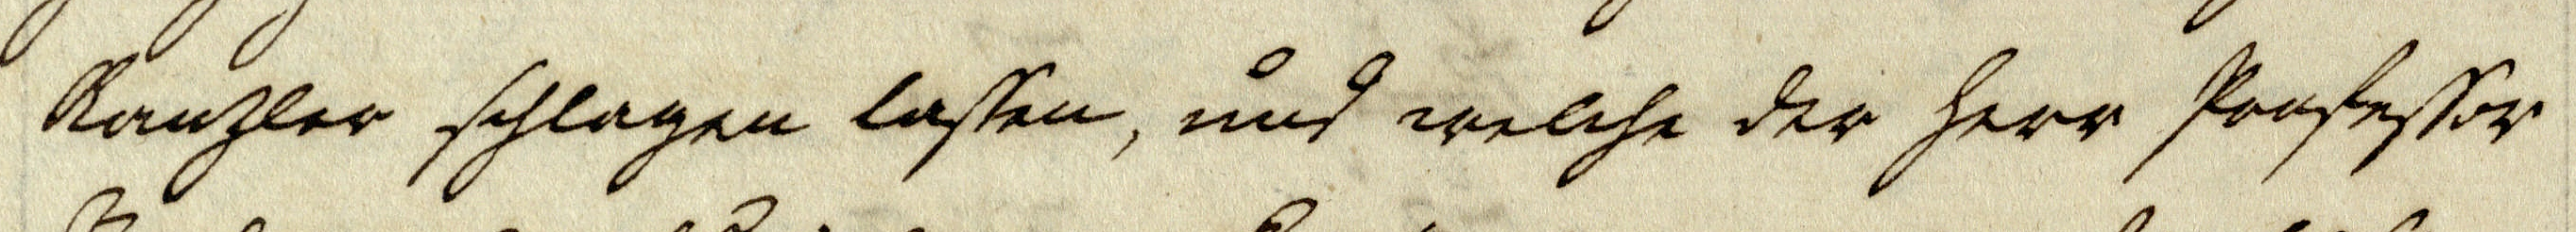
Kanzler schlagen lassen, und welche der Herr Professor
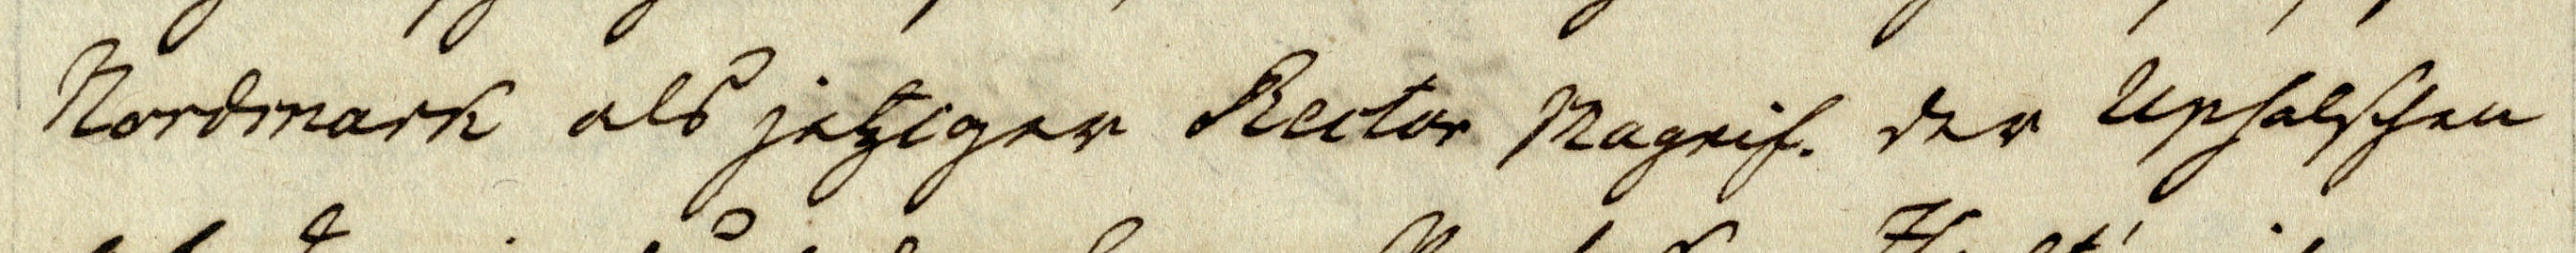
Nordmark als jetziger Rector Magnif. der Upsalschen
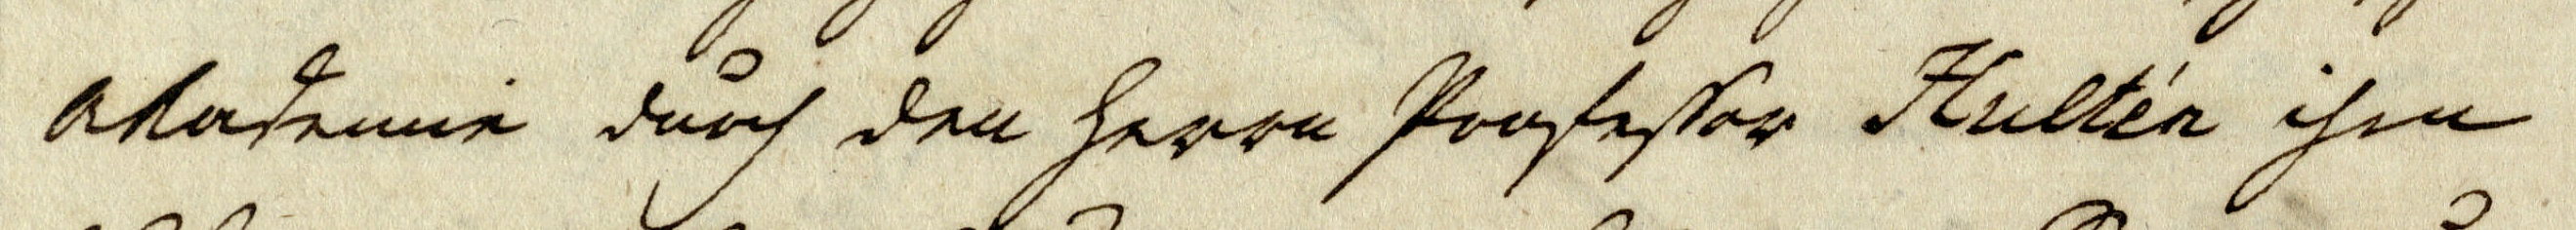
Akademie durch den Herrn Professor Hultén ihm
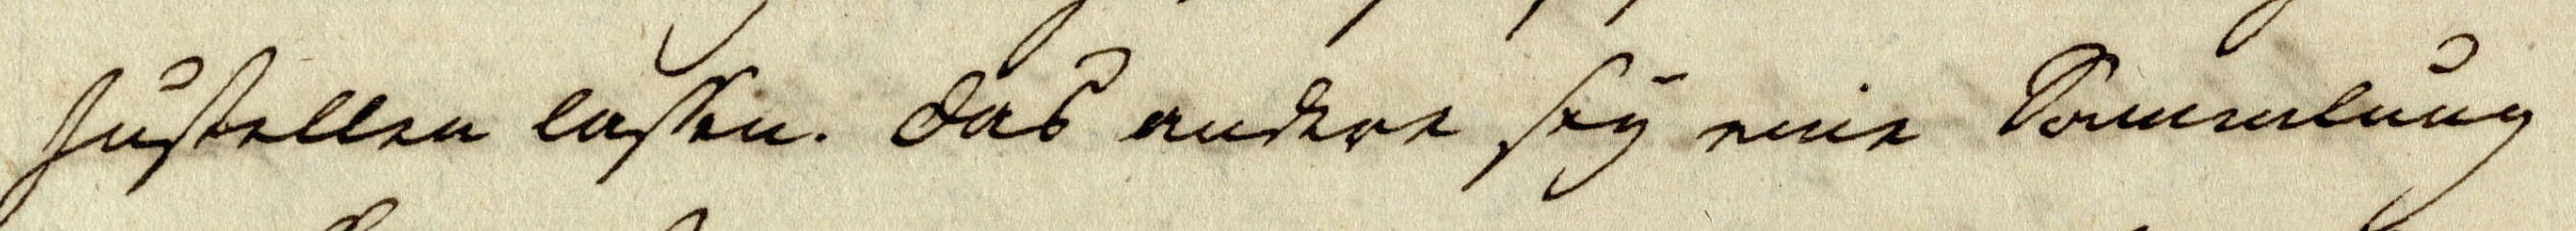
zustellen lassen. Das andere seÿ eine Sammlung
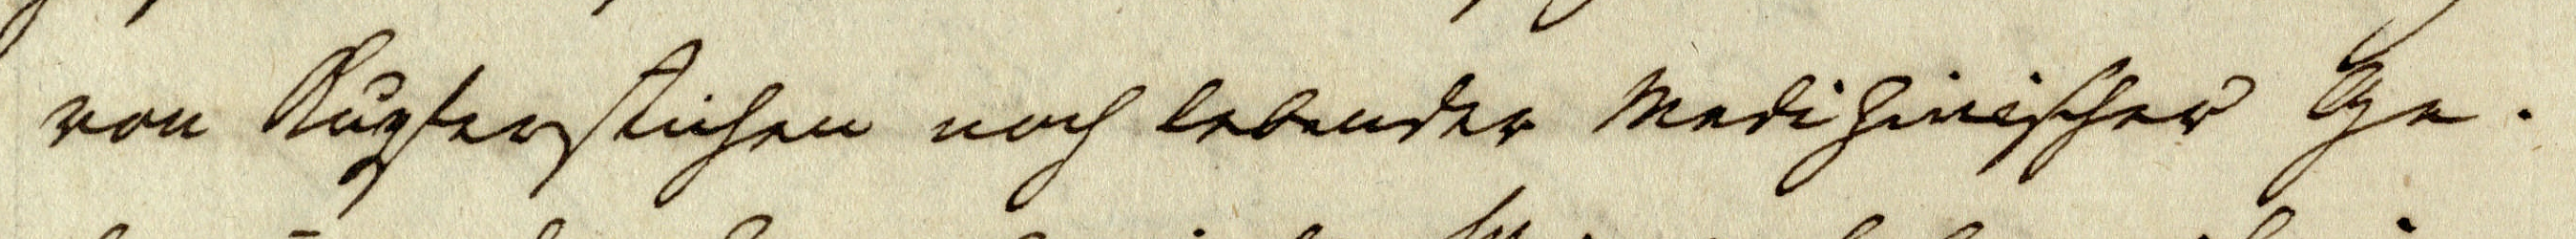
von Kupferstichen noch lebender Medizinischer Ge¬
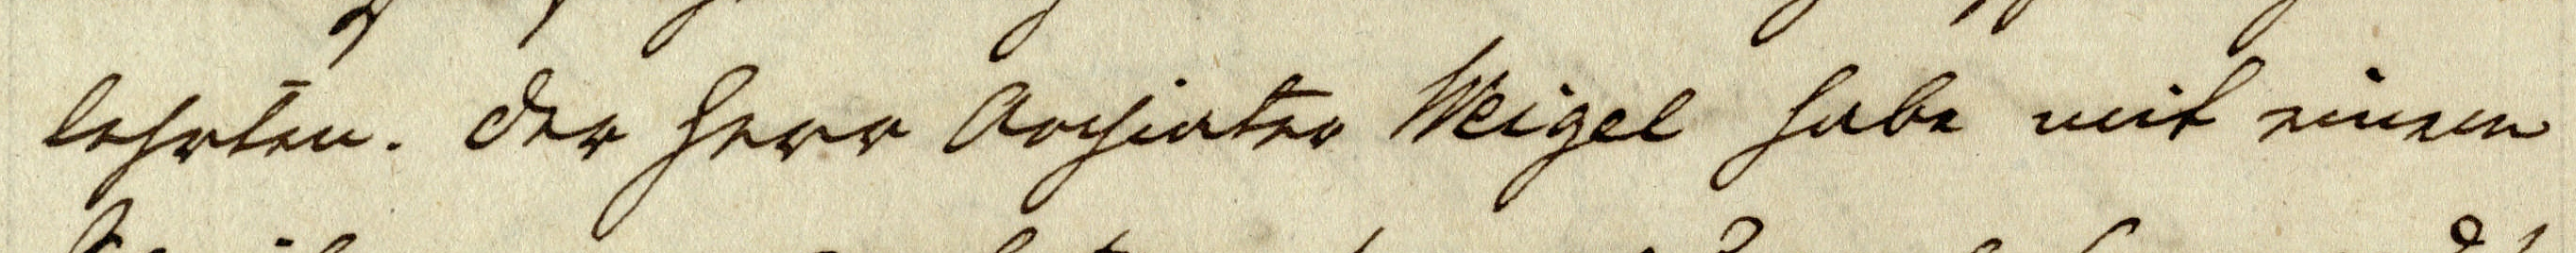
lehrten. Der Herr Archiater Weigel habe mit einem
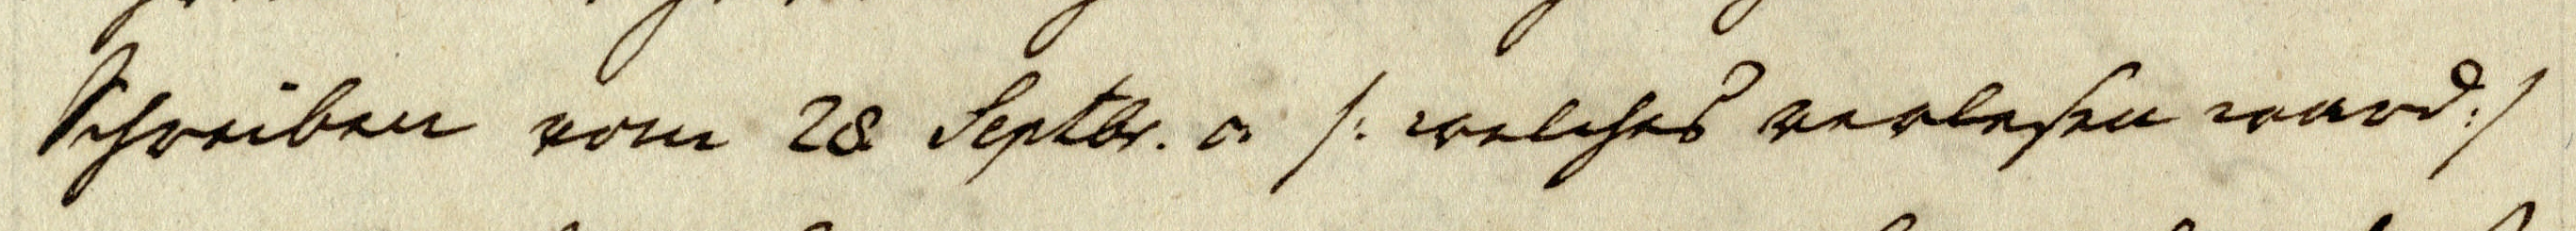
Schreiben vom 28. Septbr. c. /. welches verlesen ward./
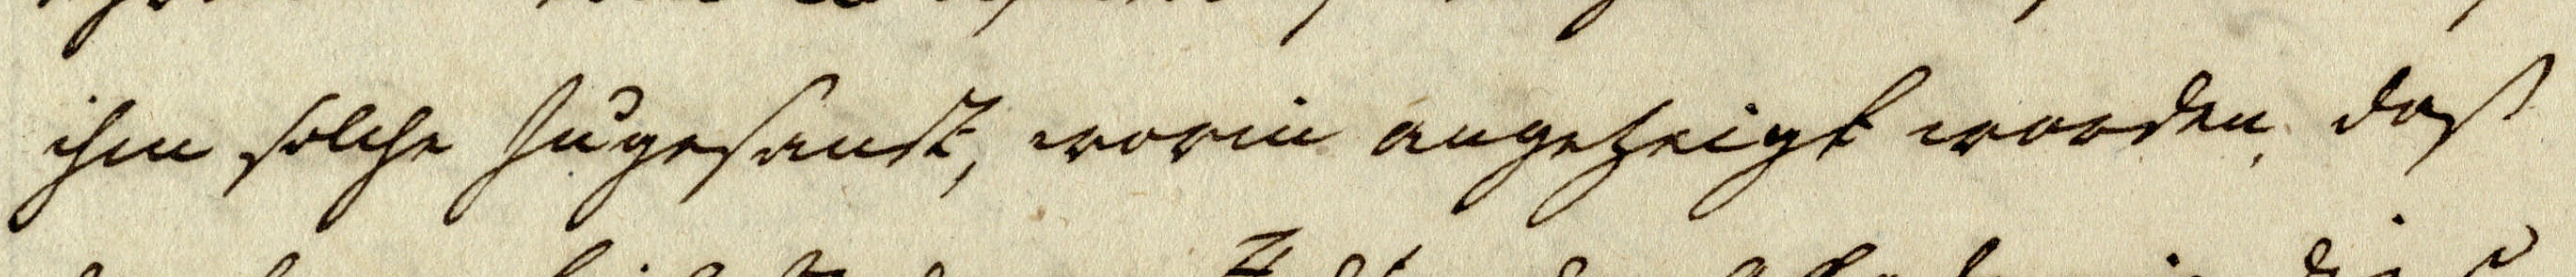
ihm solche zugesandt, worin angezeigt worden, daß
